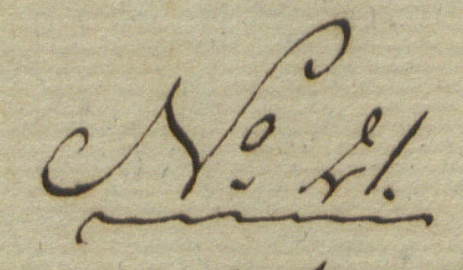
No 21.
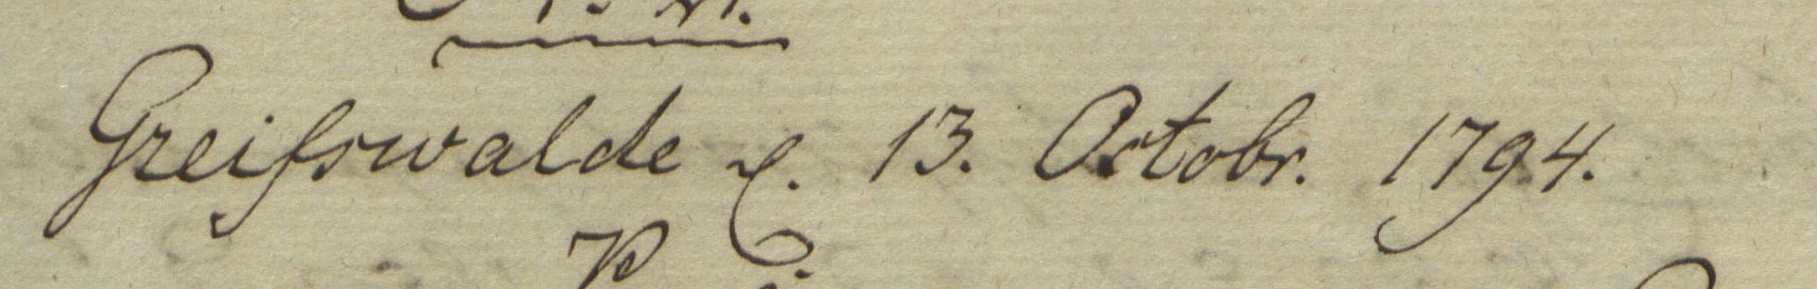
Greifswalde d. 13. Octobr. 1794.
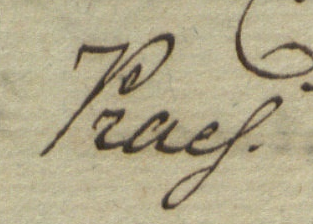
Praes.
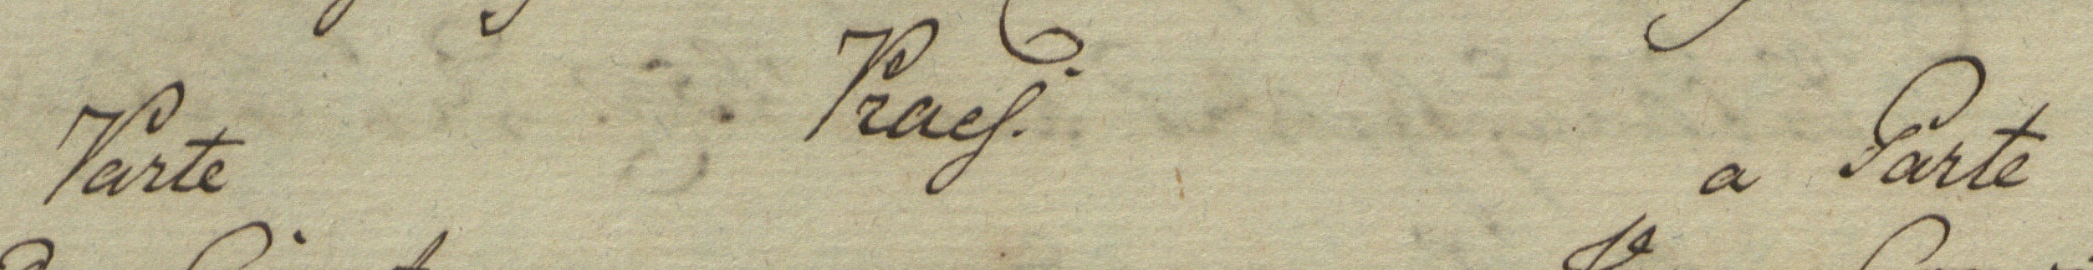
a Parte a Parte
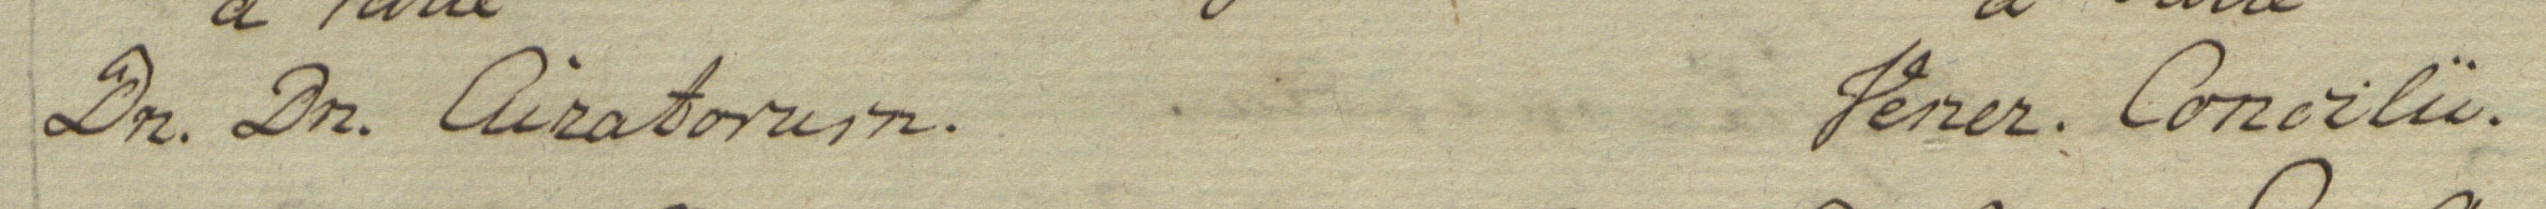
Dn. Dn. Curatorum. Vener. Concilii.
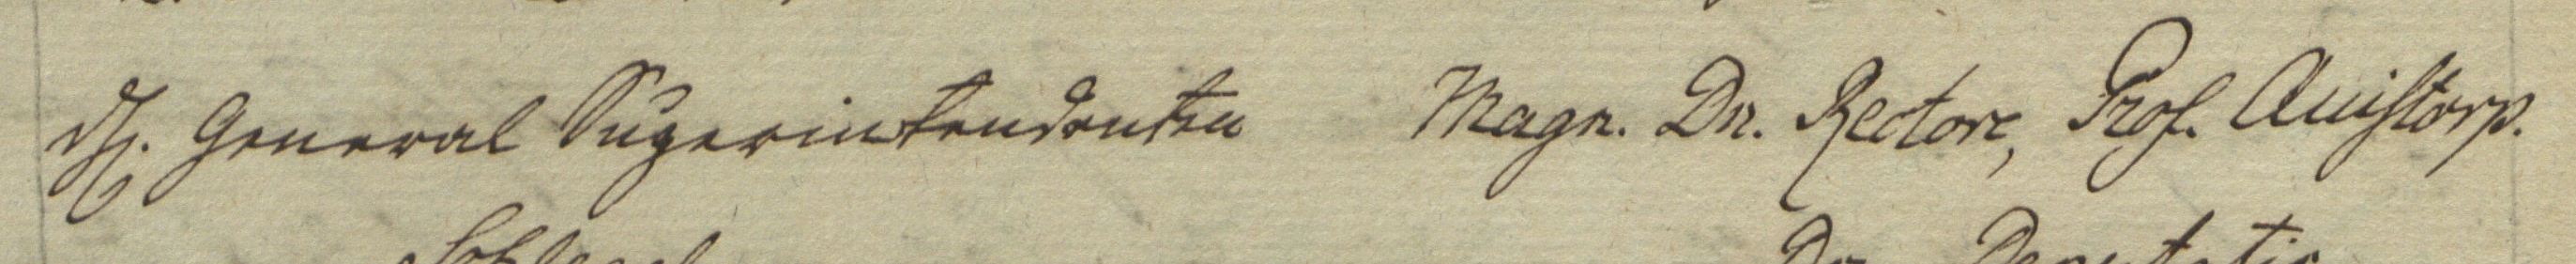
dh. General Superintendenten Magn. Dn. Rector, Prof. Quistorp.
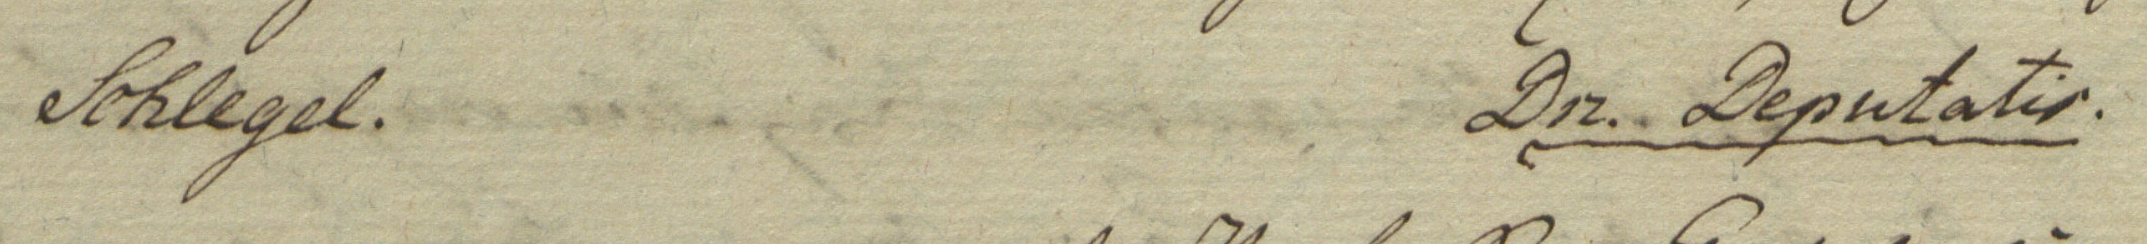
Schlegel. Dn. Deputatis.
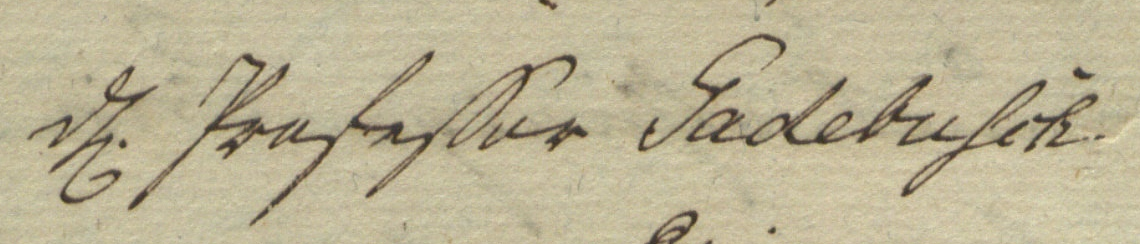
dh. Professor Gadebusch.
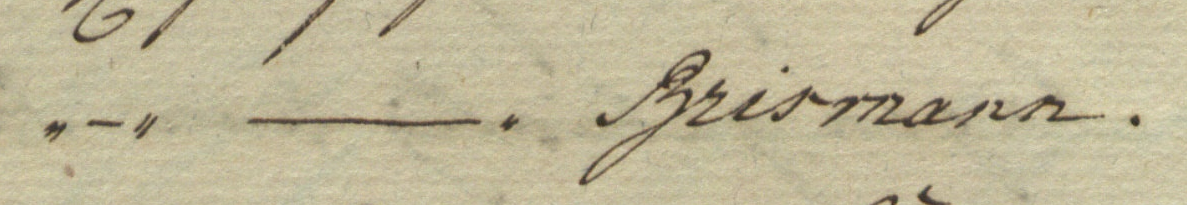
Brismann.
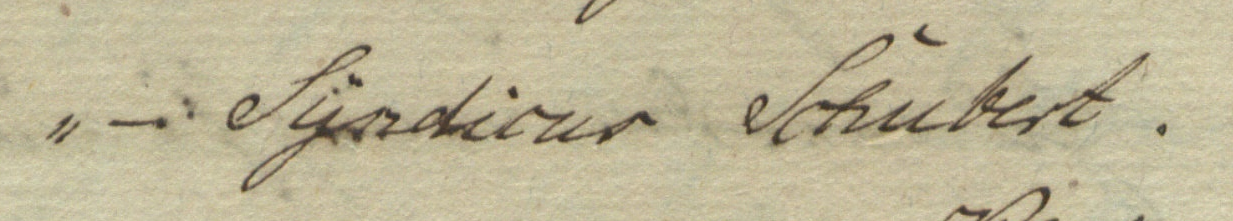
Sÿndicus Schubert.
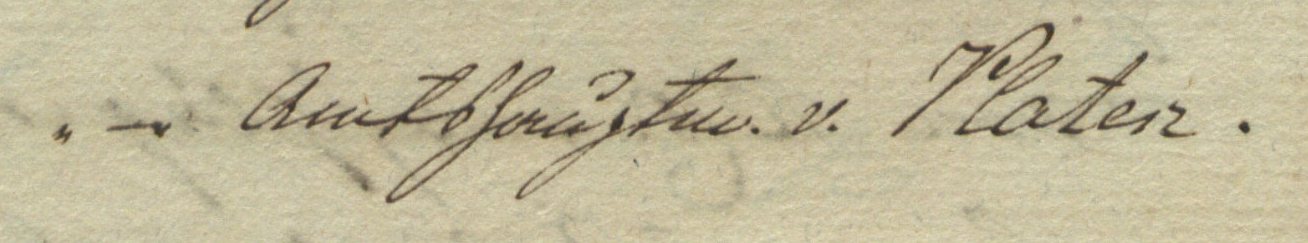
Amtshauptm. v. Platen.
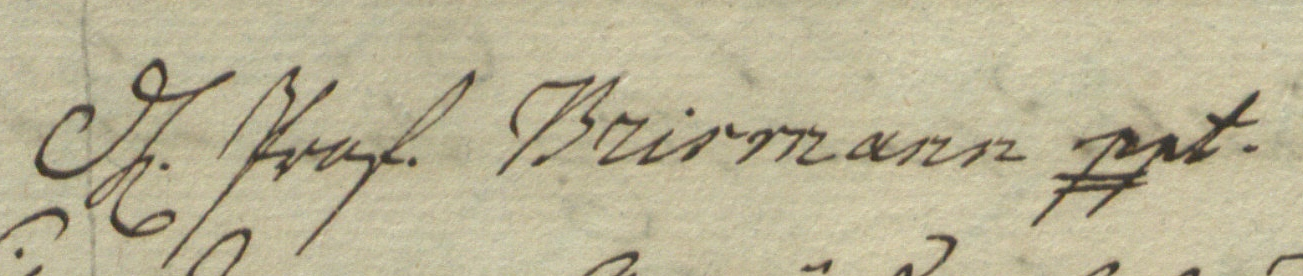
dh. Prof. Brismann ppt.
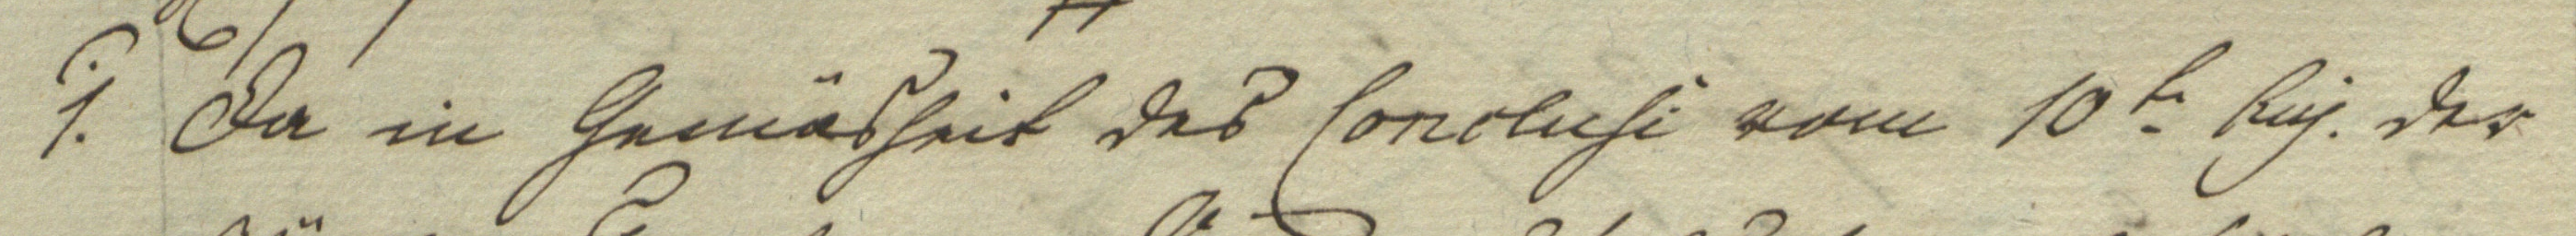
1. Da in Gemäsheit des Conclusi vom 10 t huj. der
